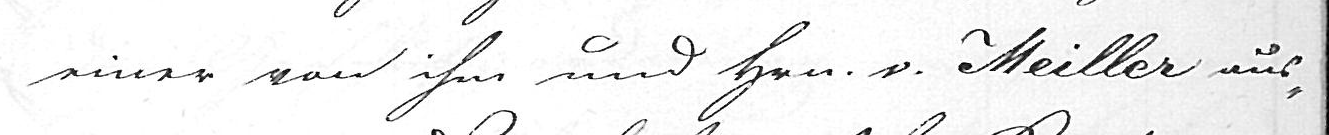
einer von ihm und Hrn. v. Meiller aus-
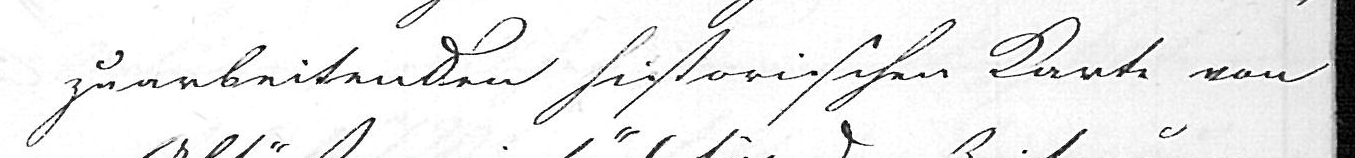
zuarbeitenden historischen Karte von
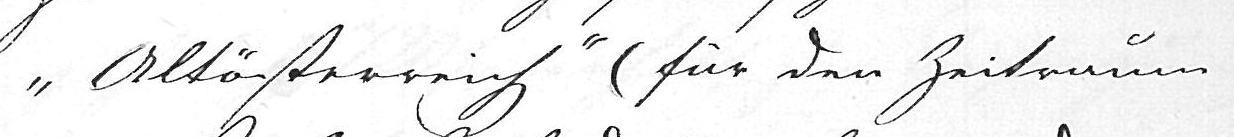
"Altösterreich" (für den Zeitraum
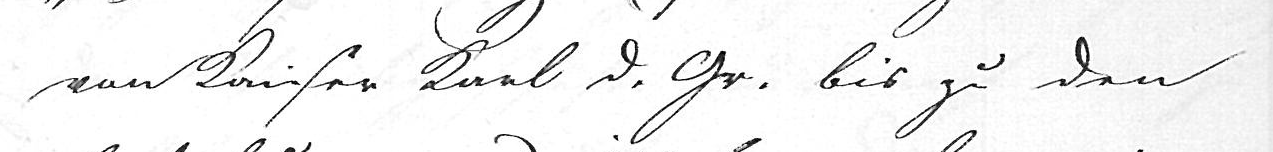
von Kaiser Karl d. Gr. bis zu den
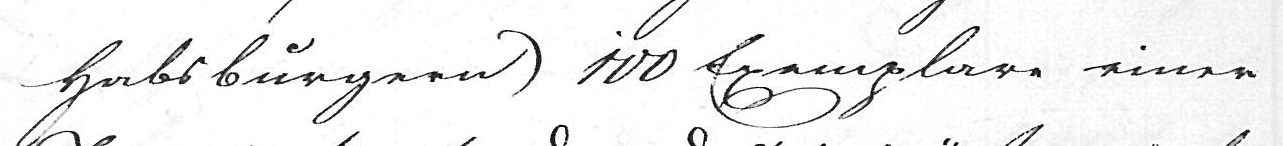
Habsburgern) 100 Exemplare einer
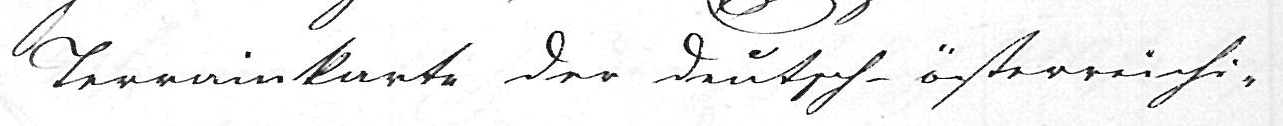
Terrainkarte der deutsch-österreichi-
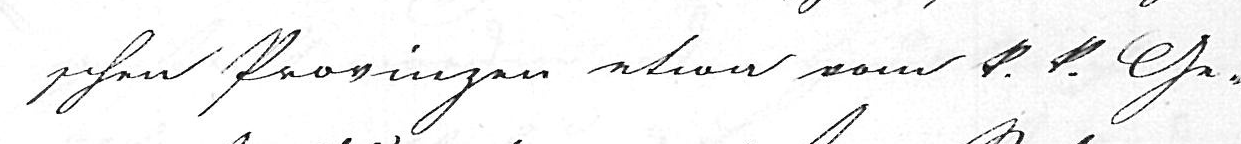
schen Prorinzen etwa vom k. k. Ge-
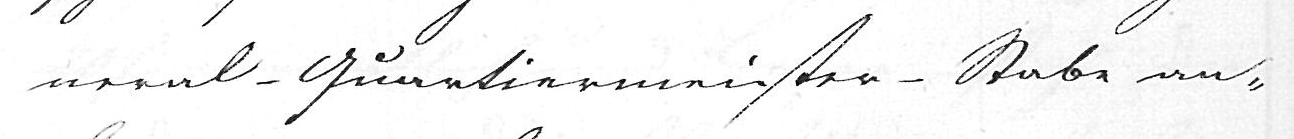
neral-Quartiermeister-Stabe an-
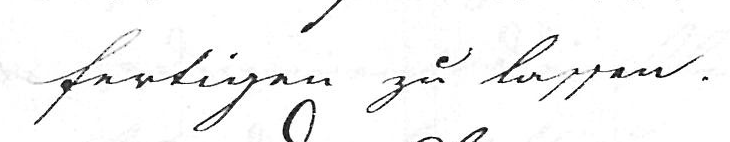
fertigen zu lassen.
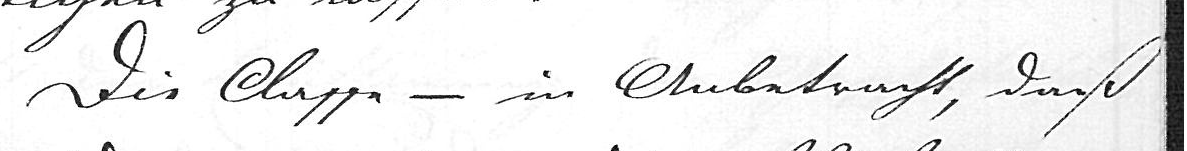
Die Classe - in Anbetracht, daß
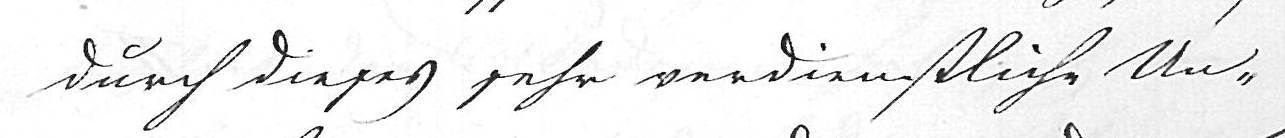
durch dieses sehr verdienstliche Un-
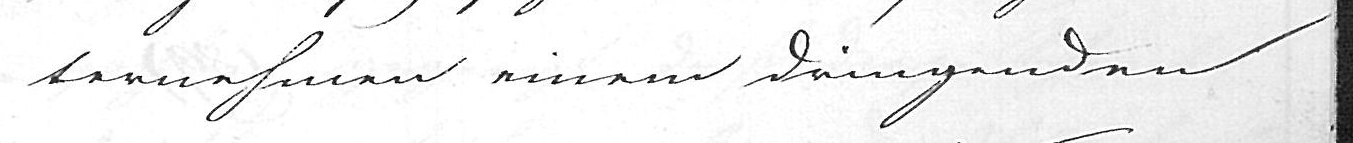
ternehmen einem dringenden
